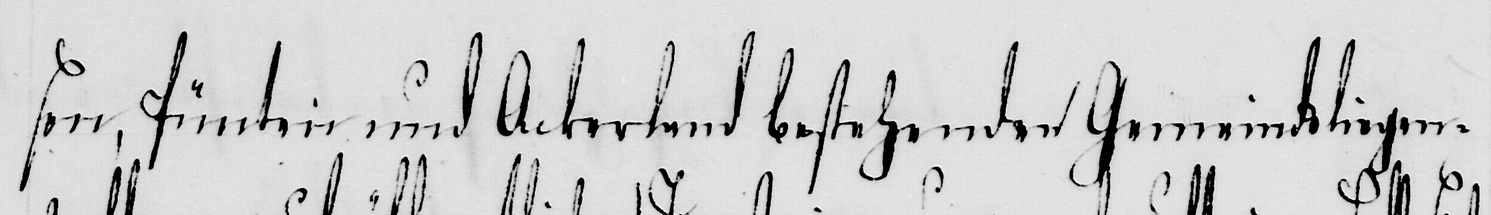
sen, Pünten und Ackerland bestehenden Gemeindsliege¬
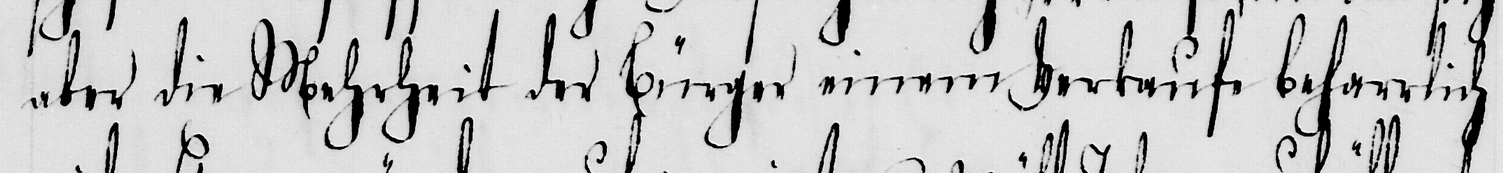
aber die Mehrheit der Bürger einem Verkaufe beharrlich
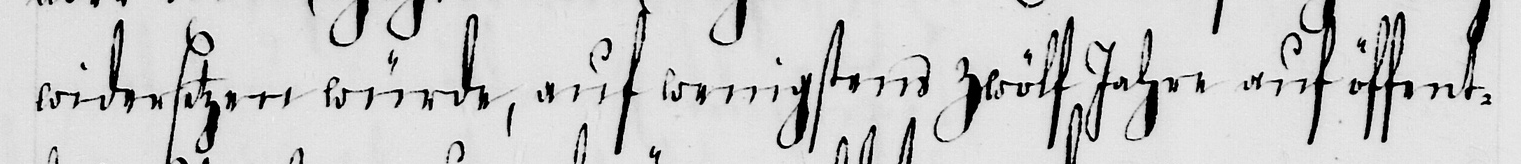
widersetzen würde, auf wenigstens zwölf Jahre auf öffent¬
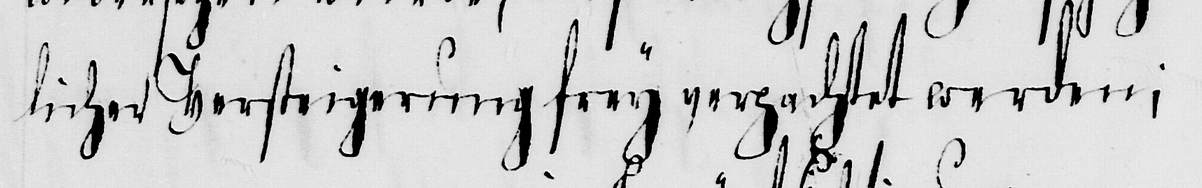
licher Versteigerung verpachtet werden;
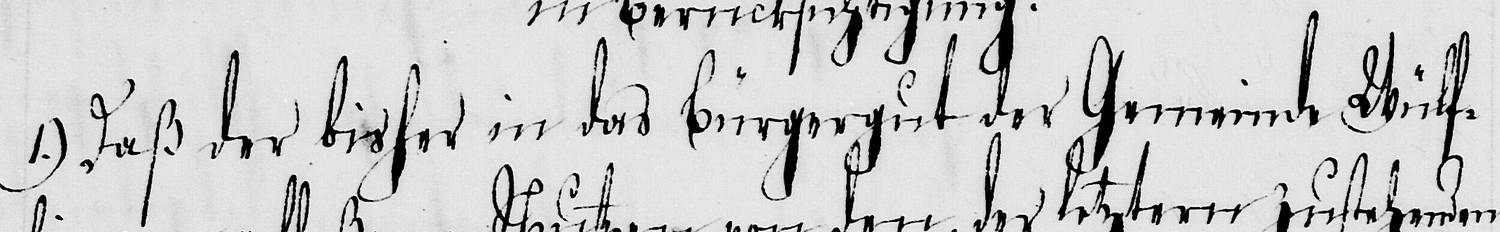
1.) Daß der bisher in das Bürgergut der Gemeinde Wülf¬
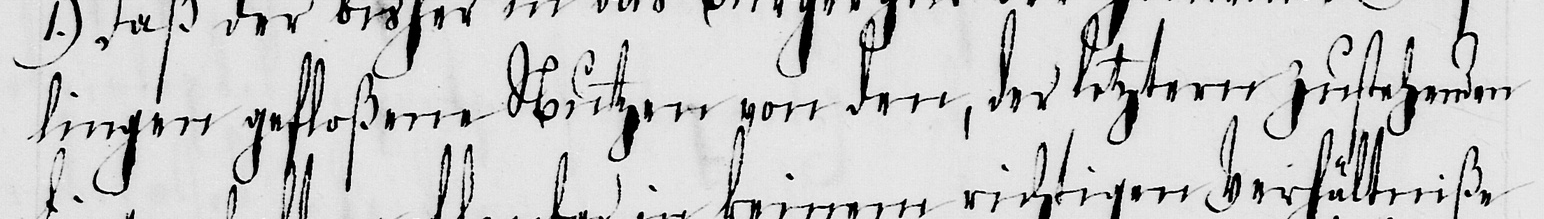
lingen gefloßene Nutzen von den, der letztern zustehenden
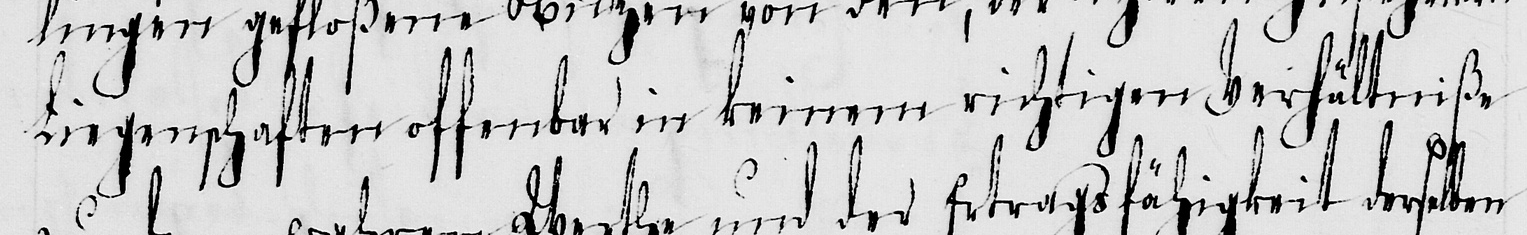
Liegenschaften offenbar in keinem richtigen Verhältniße
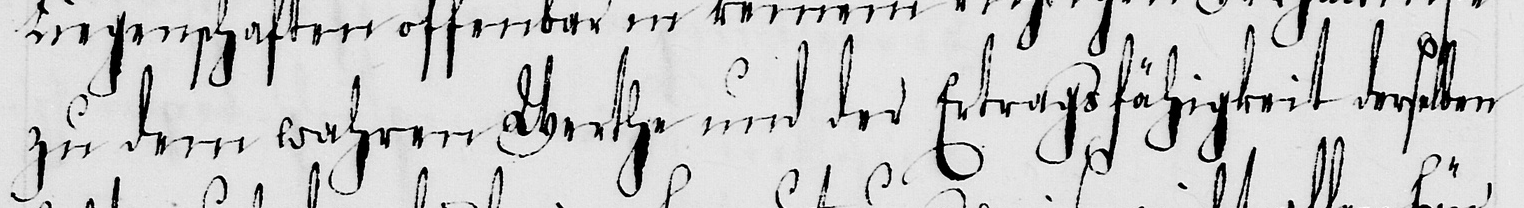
zu dem wahren Werthe und der Ertragsfähigkeit derselben
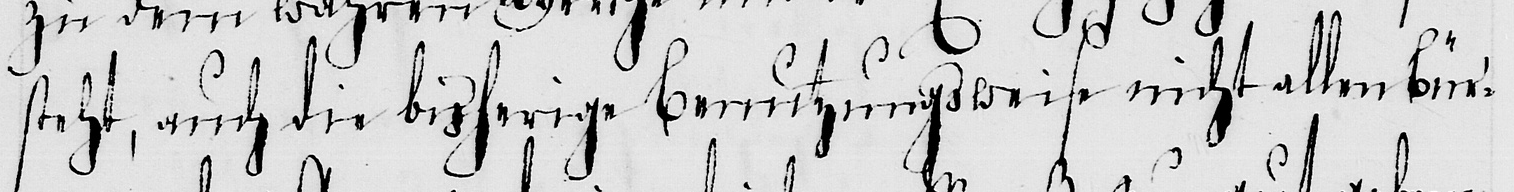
steht, auch die bisherige Benutzungsweise nicht allen Bür¬
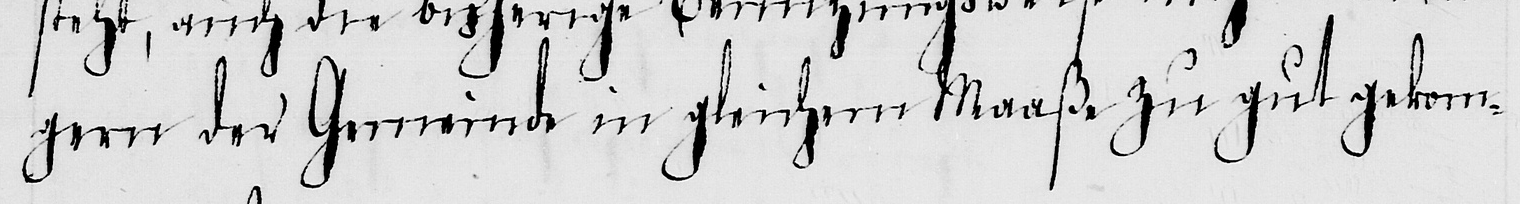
gern der Gemeinde in gleichem Maaße zu gut gekom¬
